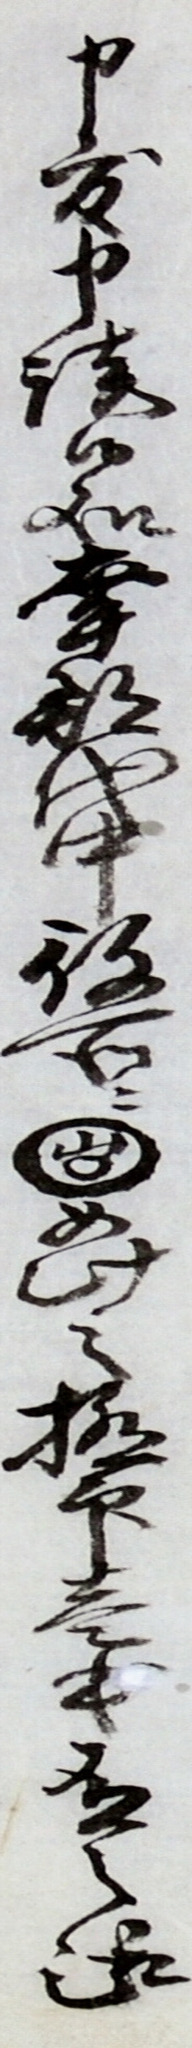申度申談候処當郡代中役所ニ〇如此極印壱本有之趣
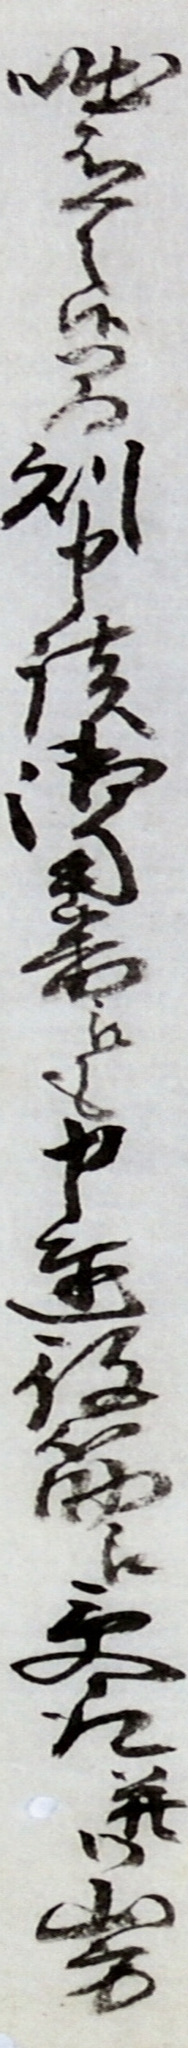咄有之候間則申談御用番江も申達役筋江受取并御山方
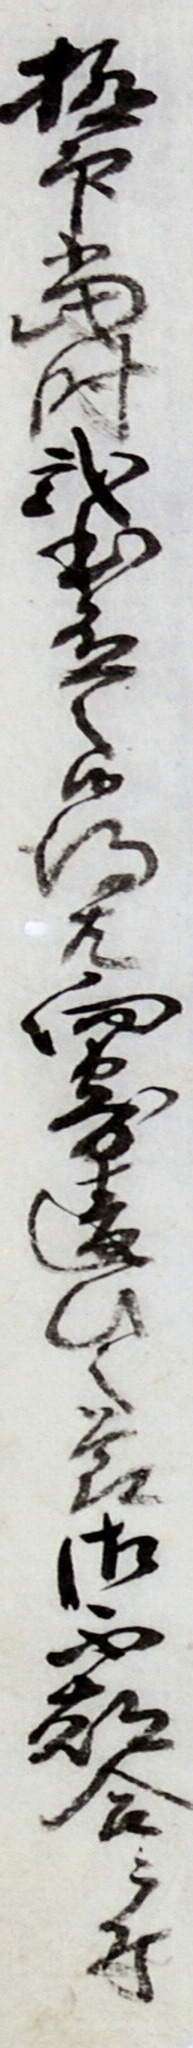板印當村弐本有之候得共向寄違ひ之節御不都合ニ付

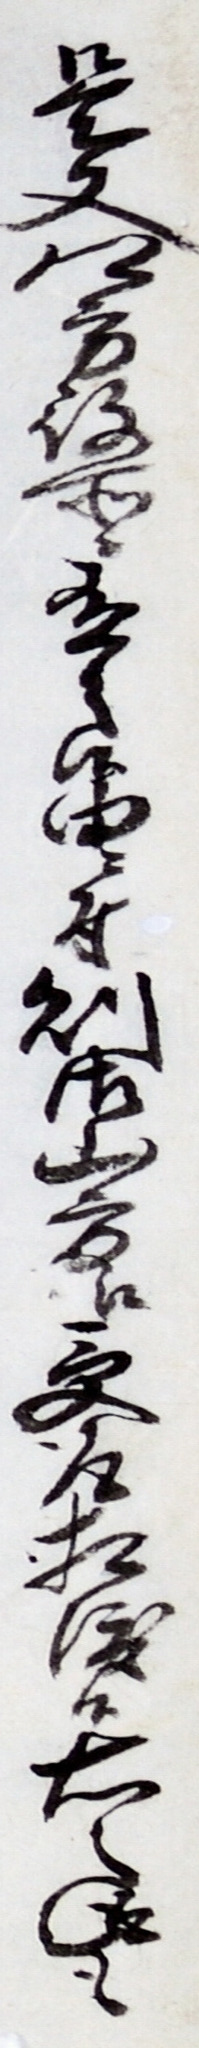是又郷方役所ニ有之候由ニ付則御山方江受取相渡候右之趣も
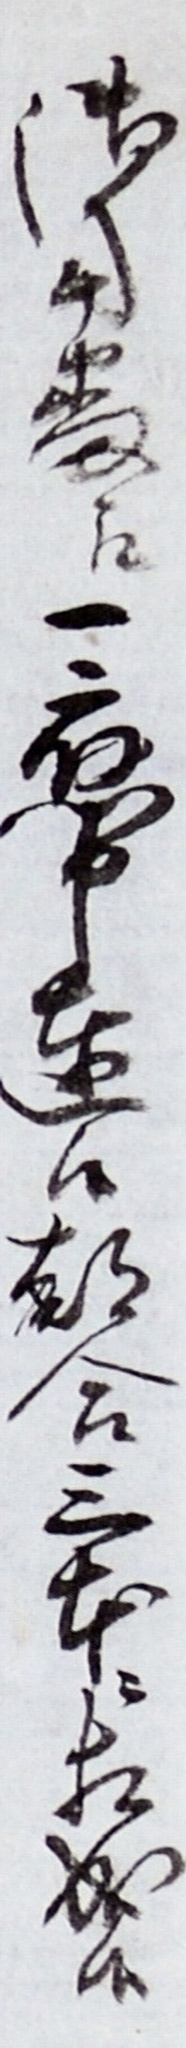御用番江一応申達候都合三本ニ相成候
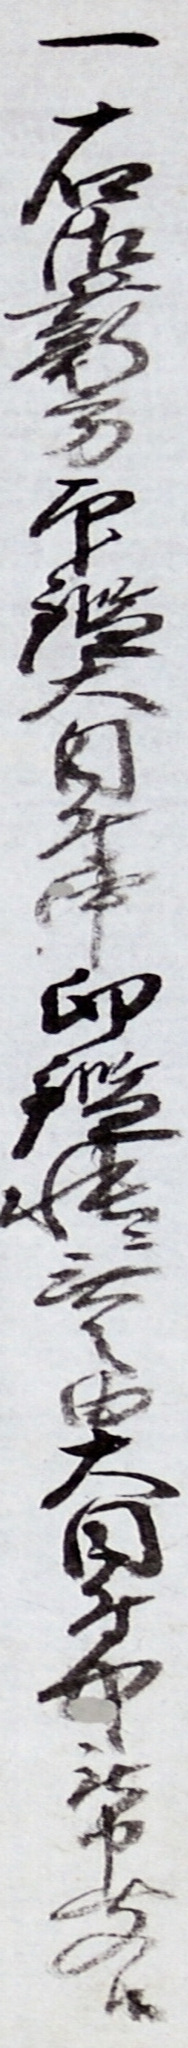一右御薪方印鑑大目付中印鑑帳ニ無之由大目付中被申聞候
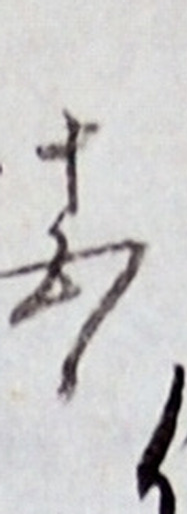十五日
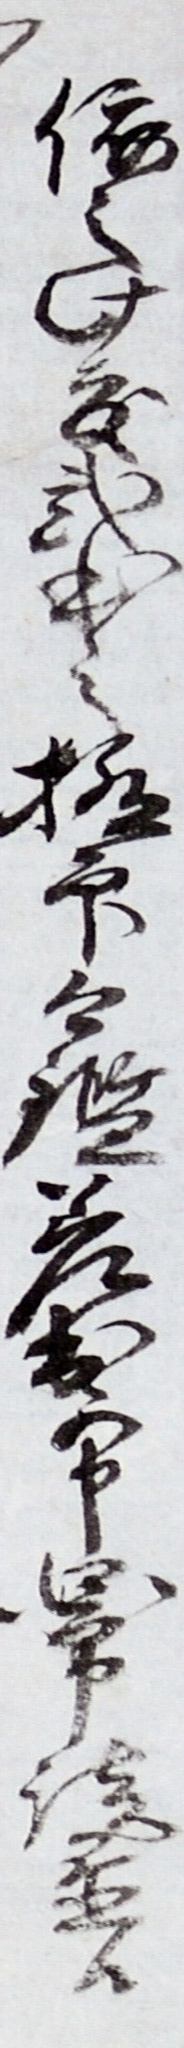依之此度弐本之極印々鑑差出可申図申談置候
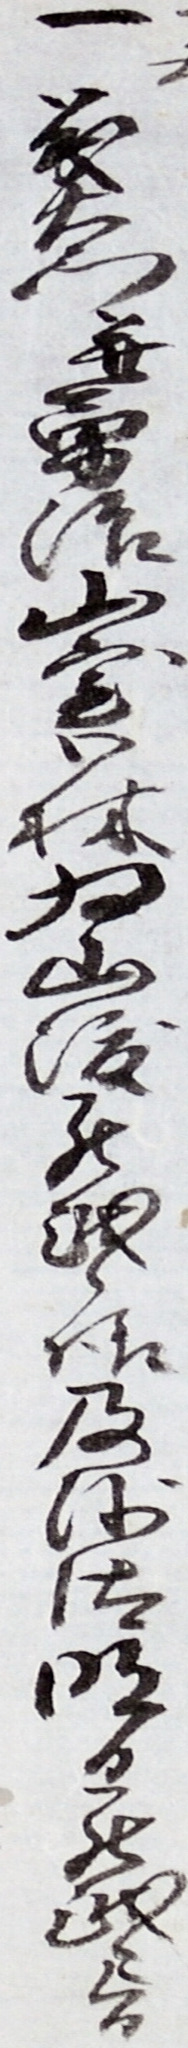一義右衛門并勇治山室御林村為山渡罷越候様及沙汰明日罷越候旨
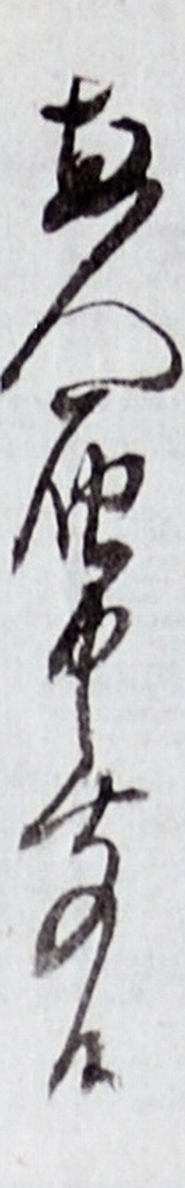両人届申聞候
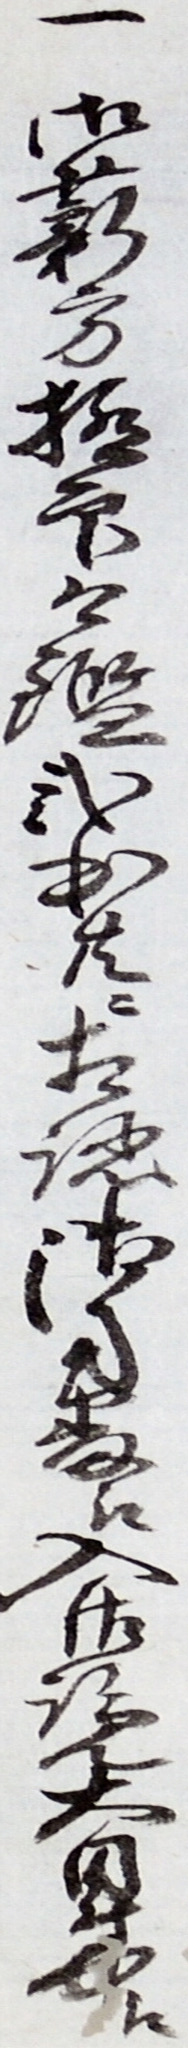一御薪方極印々鑑弐本共に相認御用番江入御覧大目付中江
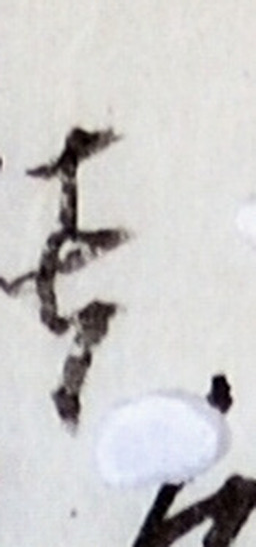十七日
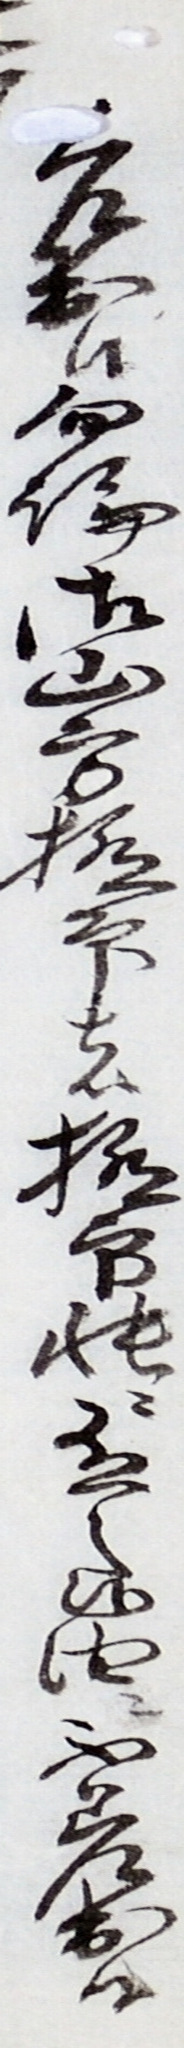差出候勿論御山方極印は格印帳ニ有之候由ニ不差出候
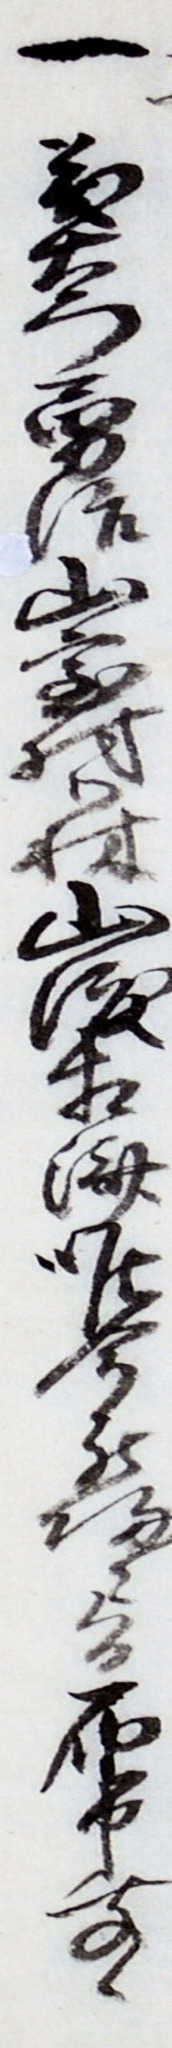一義右衛門勇治山室村御林山渡相済唯今罷帰候旨届申聞候
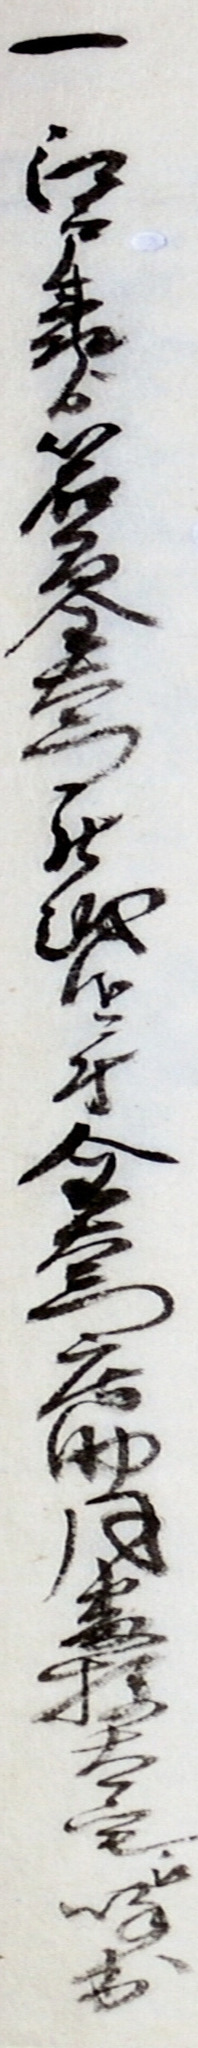一江戸表より間金右衛門罷越候ニ付金右衛門庄助月番捨太宅江呼出
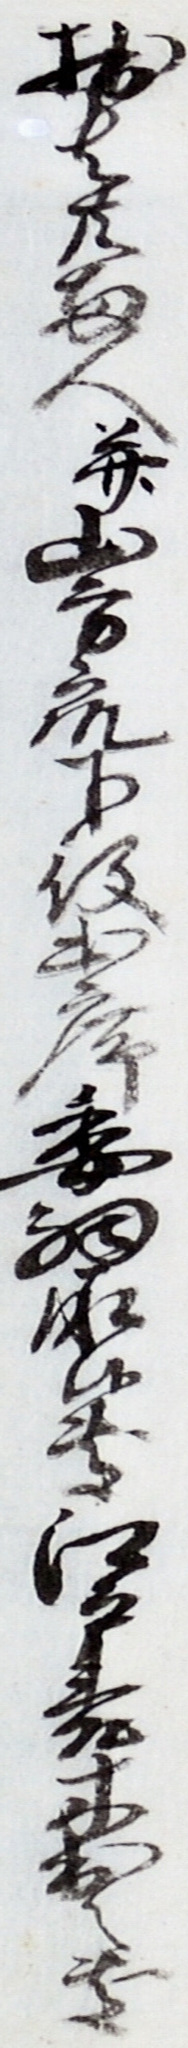物者共両人并山方衆下役出席委細承候処江戸表木出之処
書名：御山奉行御用控
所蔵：伊那市立高遠町図書館・合同会社AMANE
